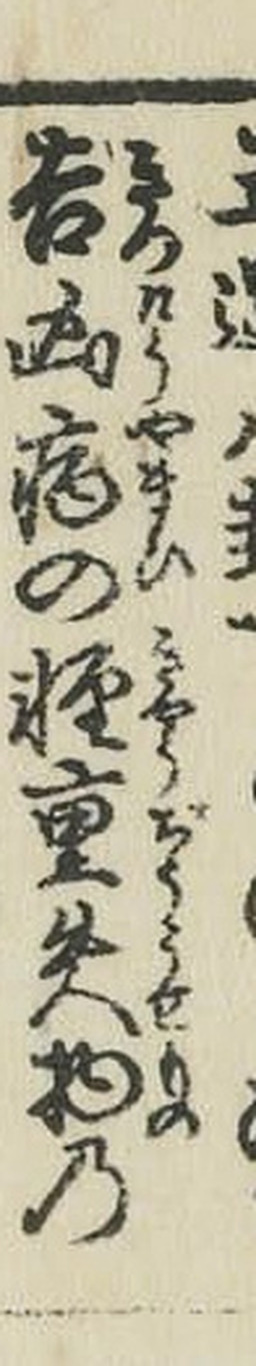吉凶病の軽重失物の
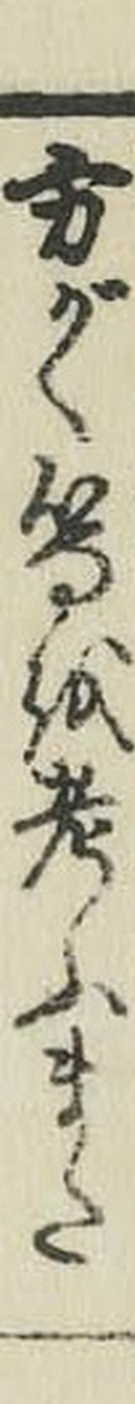方がく等を考ふまた
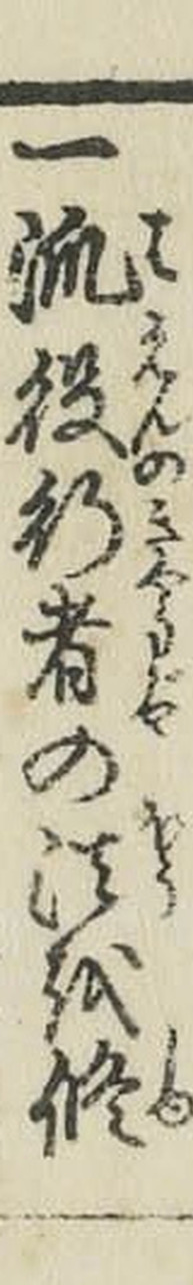一派役行者の法を修
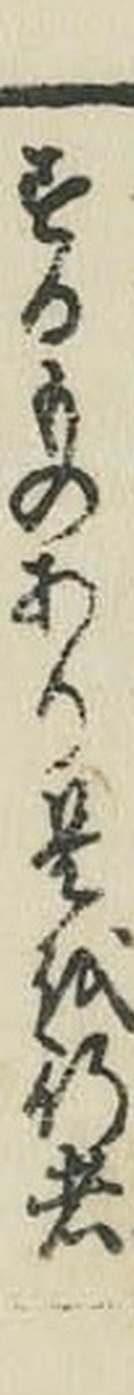するものあり是を行者
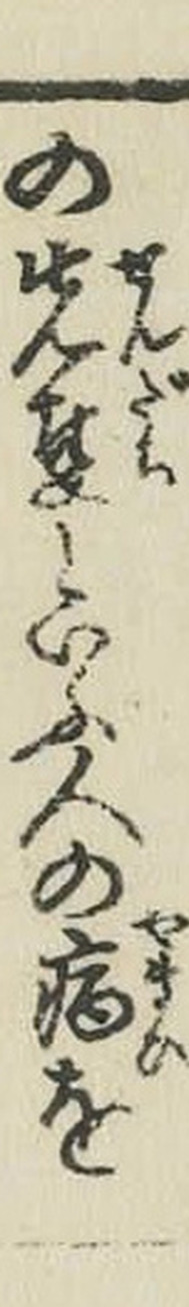の先達といふ人の病を
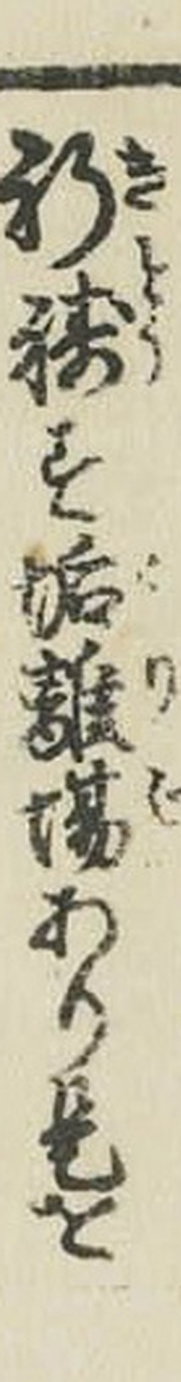祈祷す垢離場あり是を
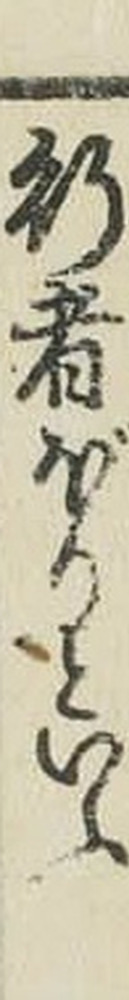行者ぼりといふ
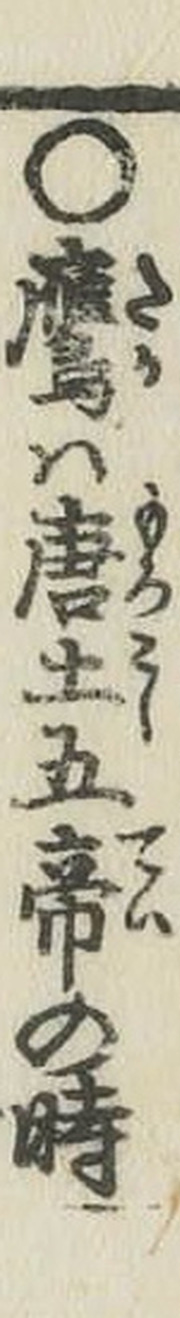○鷹は唐土五帝の時
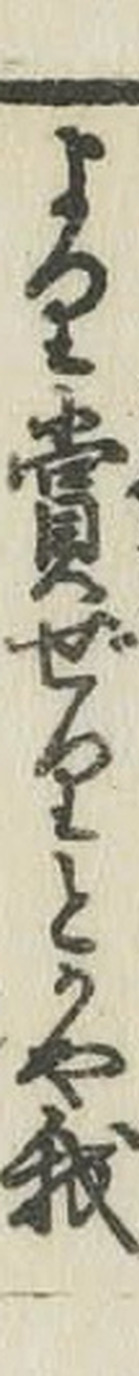より賞ぜりとかや我
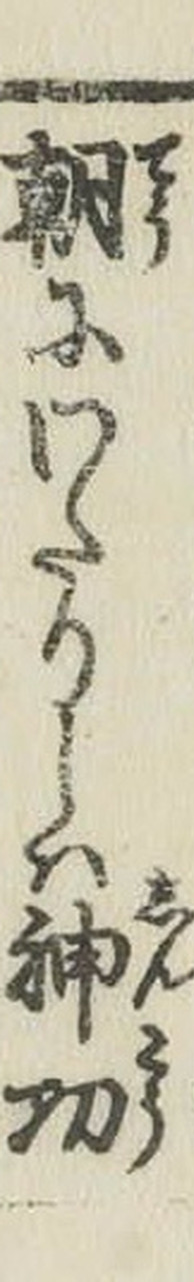朝にわたりしは神功
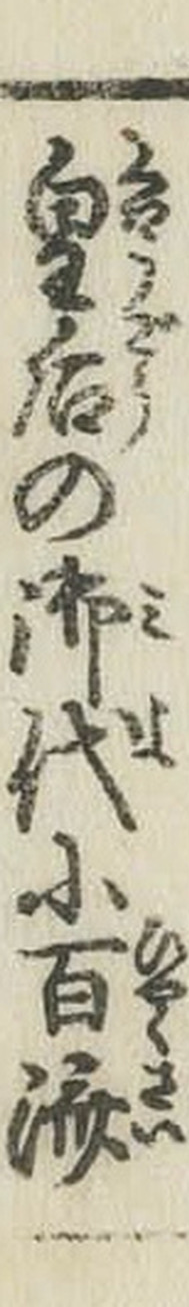皇后の御代に百済
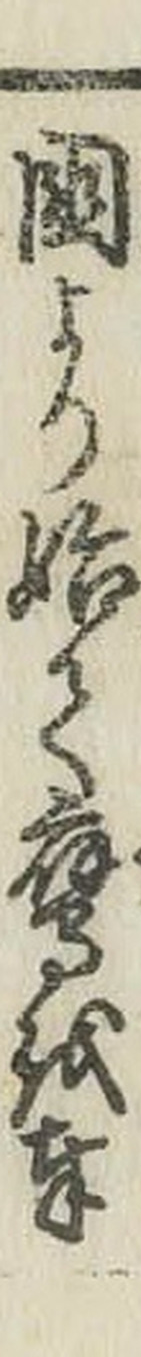国より始て鷹を奉
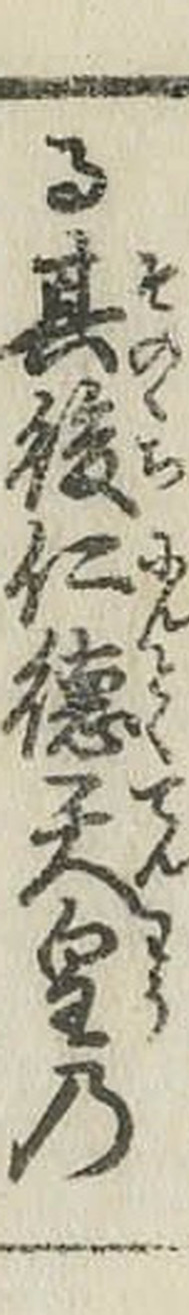る其後仁徳天皇の
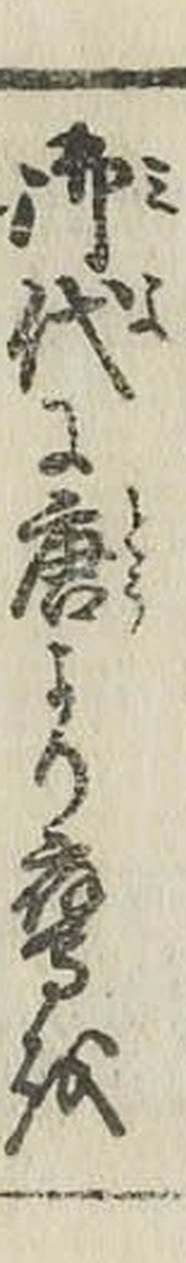御代に唐より鷹を
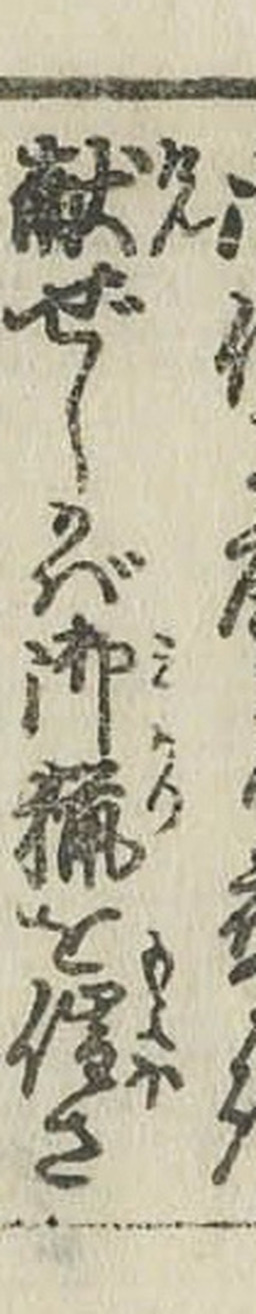献ぜしかば御猟を催さ
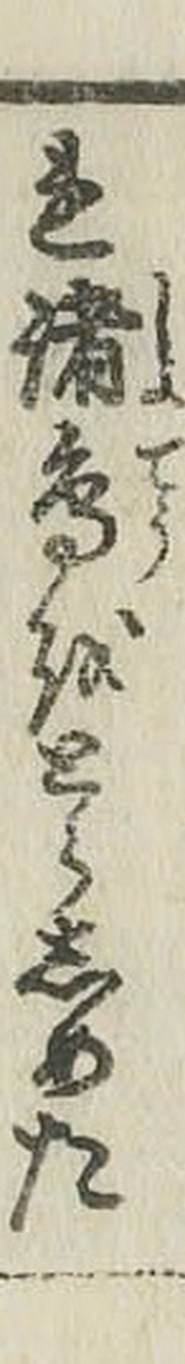れ諸鳥をとらしめた
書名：増補頭書訓蒙図彙大成 10巻 10:巻之21
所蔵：東京学芸大学教育コンテンツアーカイブ
